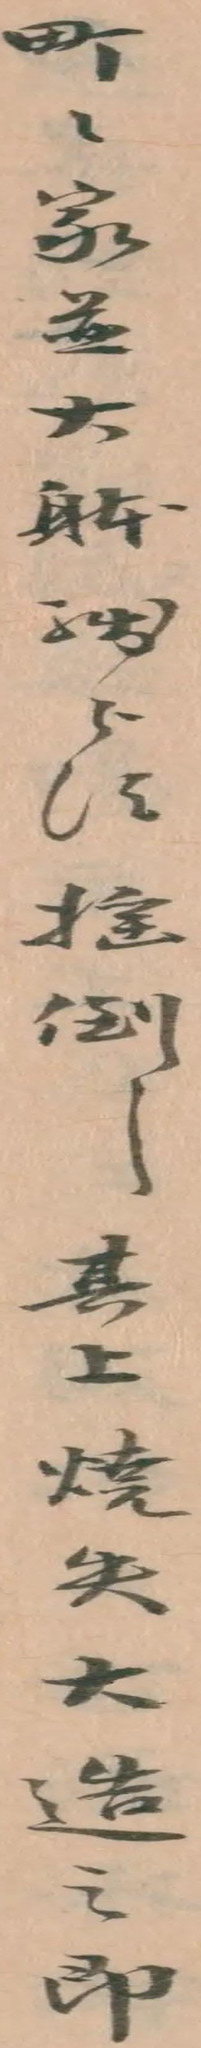町々家並大体残らず揺倒し其上焼失大造之即
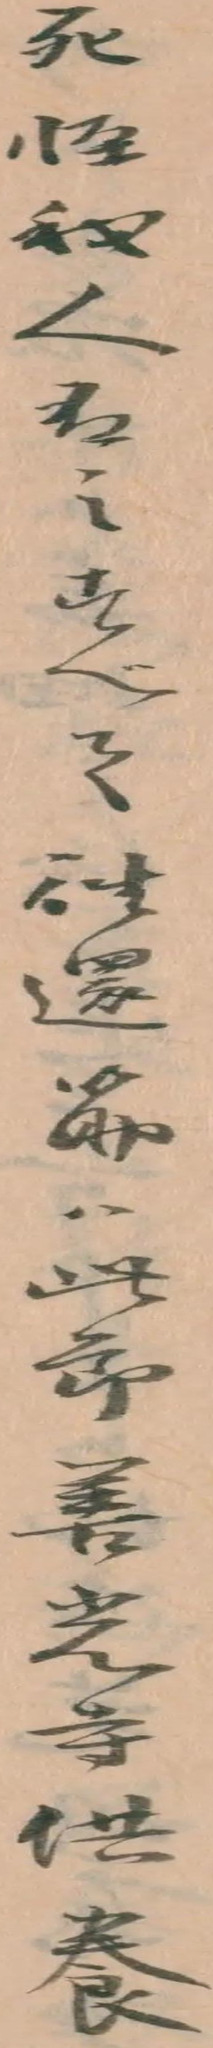死怪我人有之すべて往還筋ハ此節善光寺供養
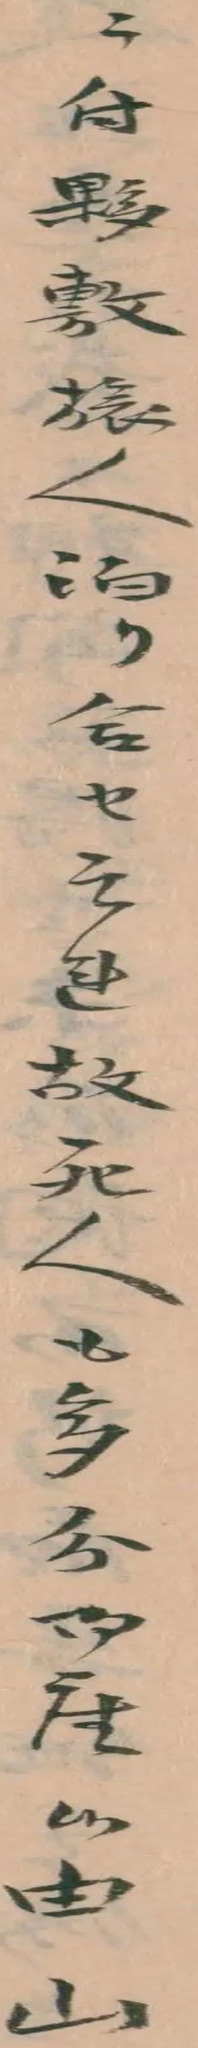ニ付夥敷旅人泊り合せそれ故死人も多分御座候由山
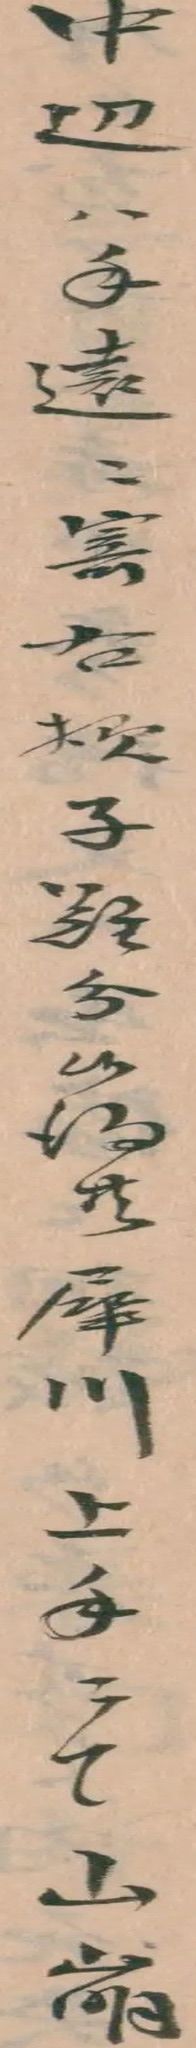中辺ハ手遠二寄右様子難分候得共犀川上手ニて山崩
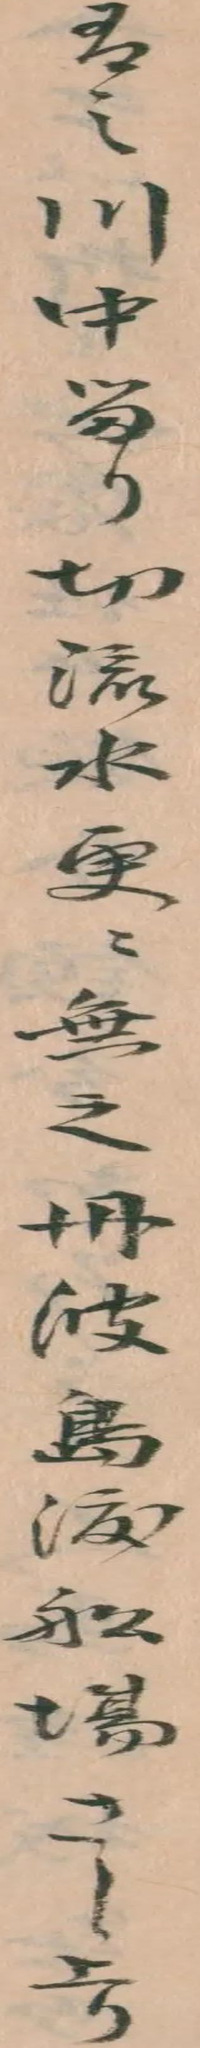有之川中留り切流水更ニ無之丹波島渡船場さし上り
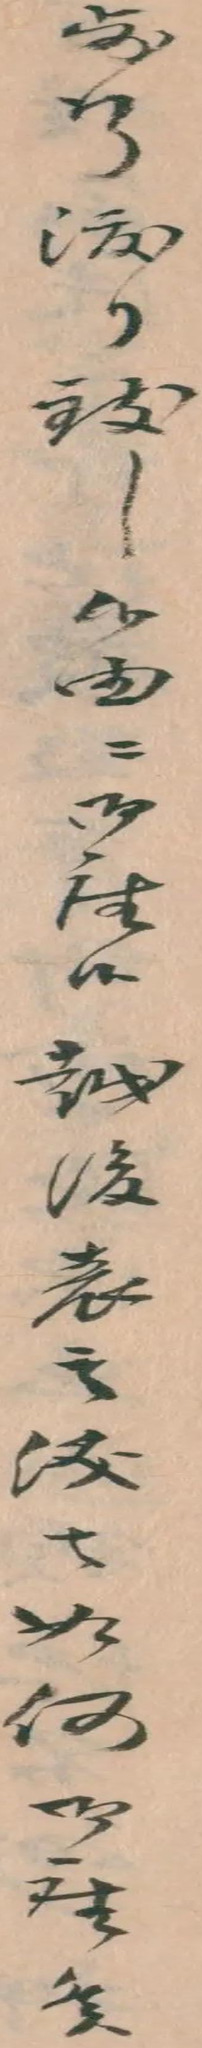歩行渡り致し候由ニ御座候越後表之儀者如何御座候
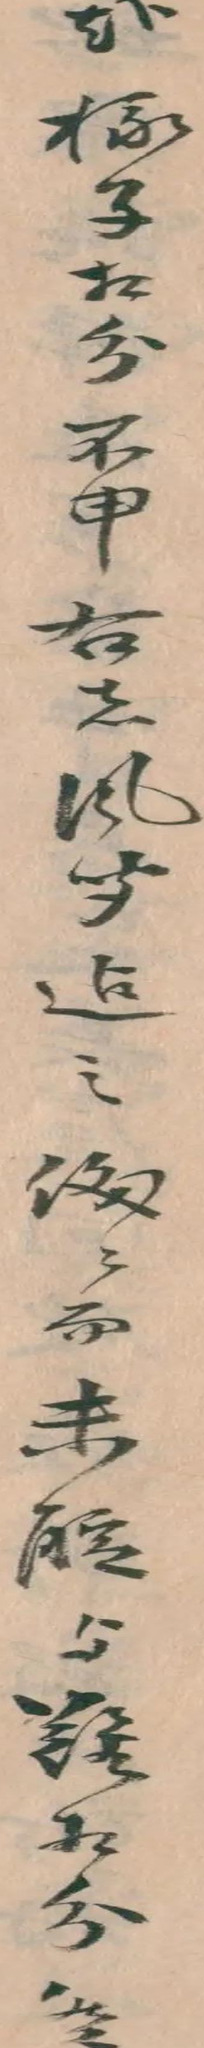哉様子相分不申右者風聞迄之儀ニ而聢と難相分候
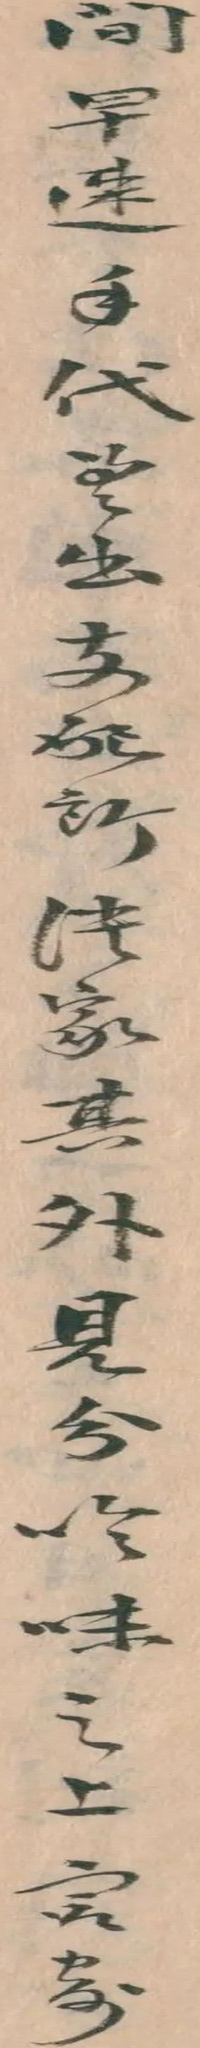間早速手代差出支配所潰家其外見分吟味之上最寄
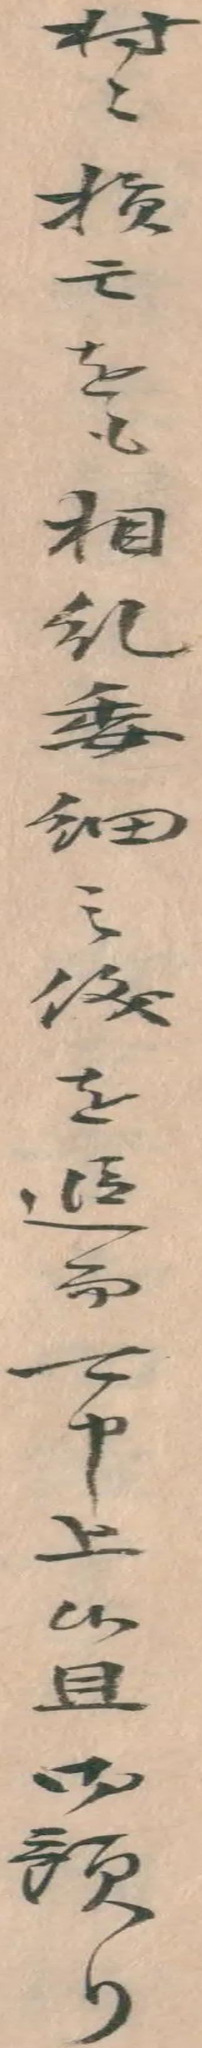村々損亡をも相糺委細之儀を追而可申上候且御預り
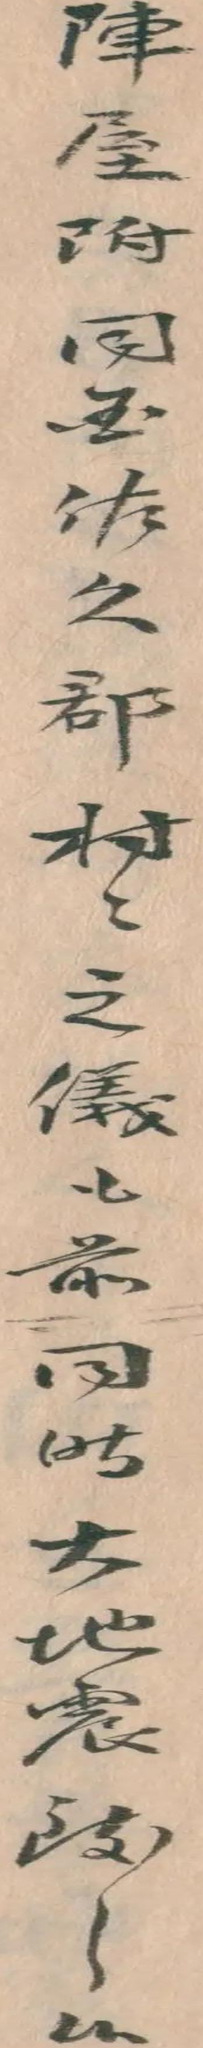陣屋附同国佐久郡村々之儀も前同時大地震致し候
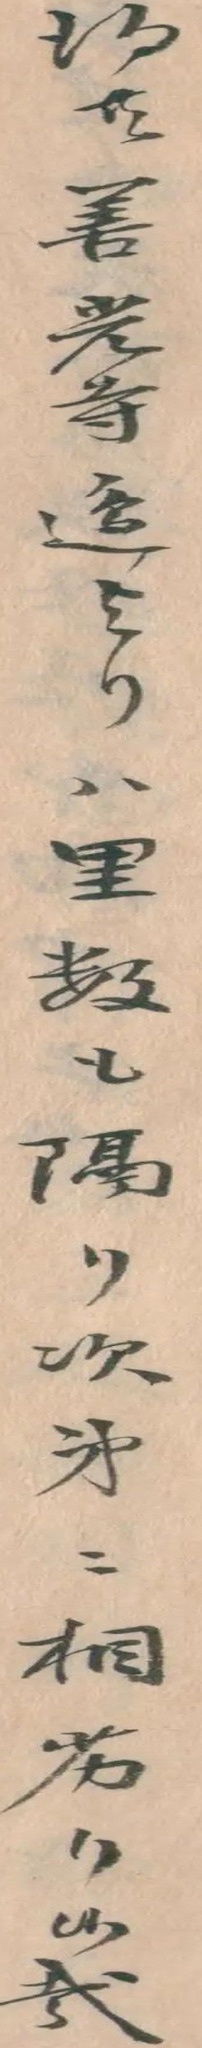得共善光寺辺よりハ里数も隔り候次第二相劣り候哉
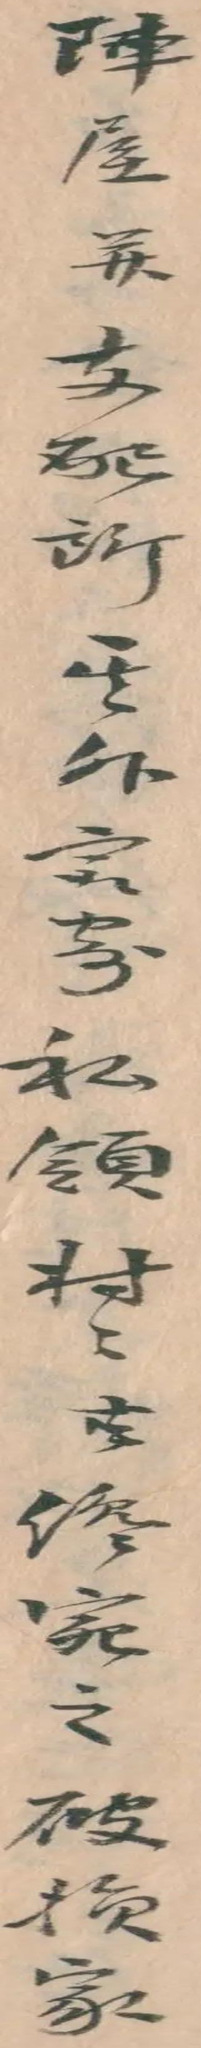陣屋并支配所其外最寄私領村々共纔宛之破損家

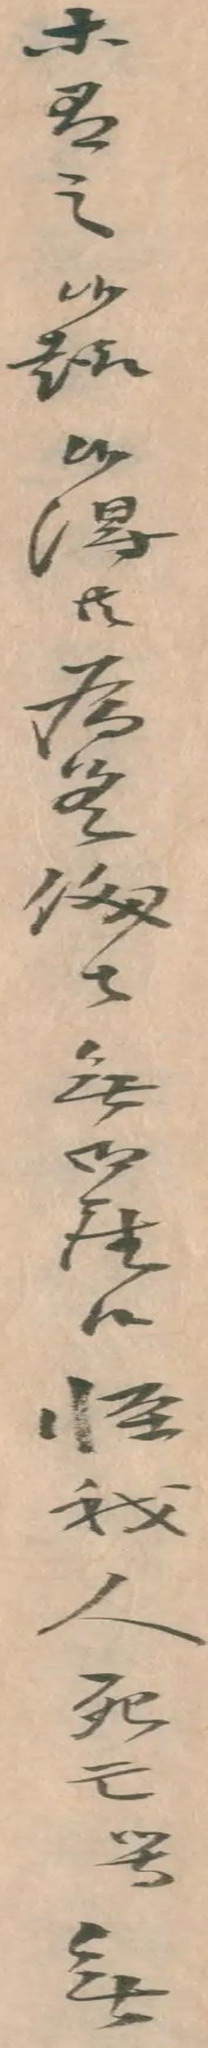等有之候趣候得共為差儀者無御座怪我人死亡等無
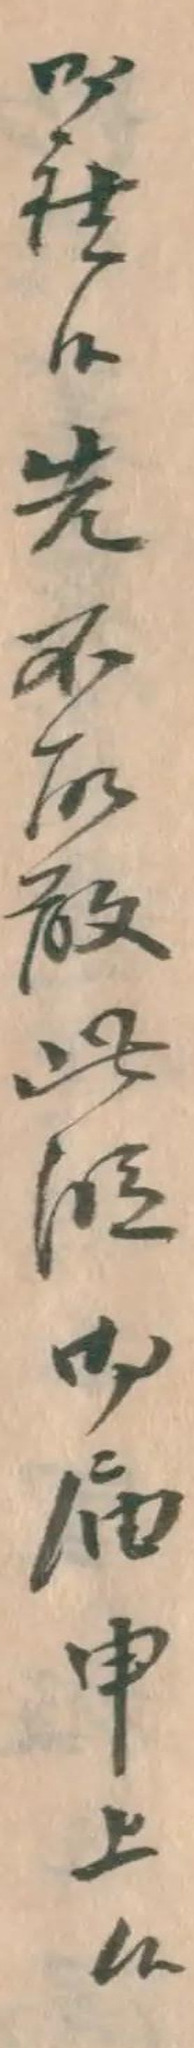御座候先不取敢此段御届申上候
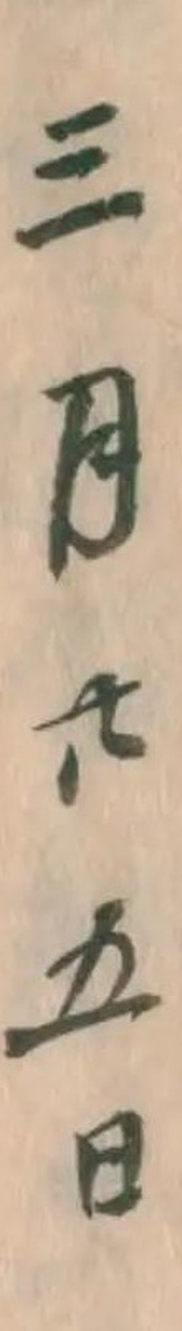三月廿五日
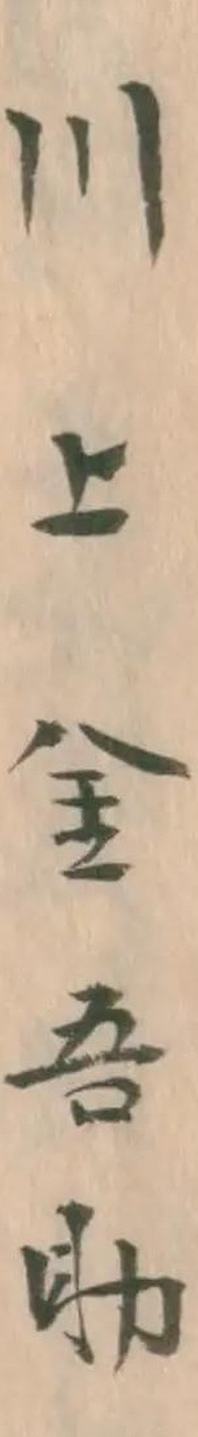川上金吾助
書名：地災撮要. 巻3(地震之部)-巻4(噴火之部)
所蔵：国立国会図書館 National Diet Library, JAPAN
